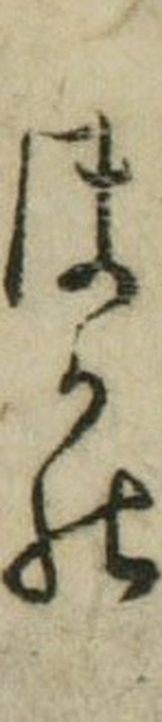ほかの
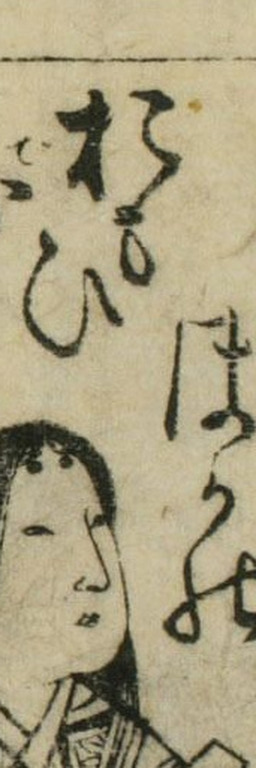おもひ
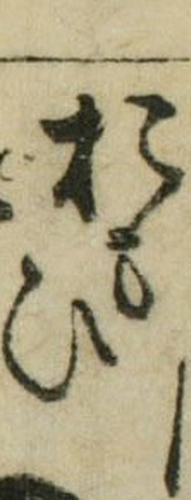おもひ
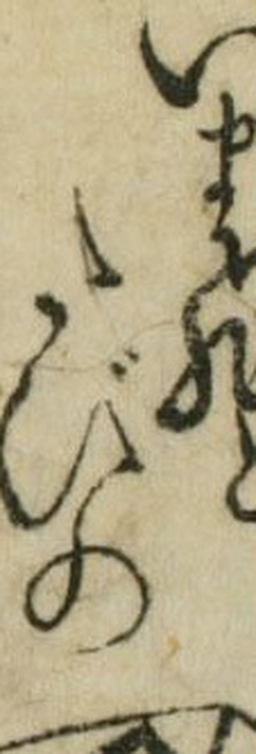たびの
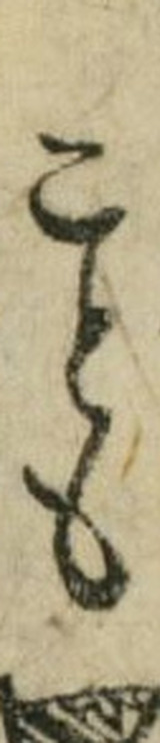ことも
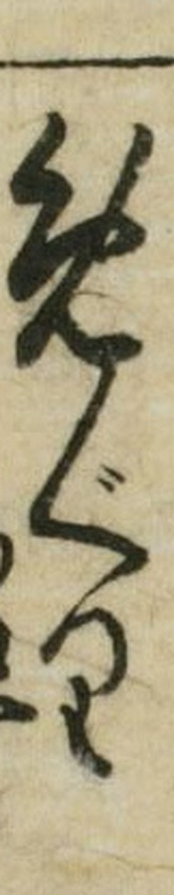めぐり
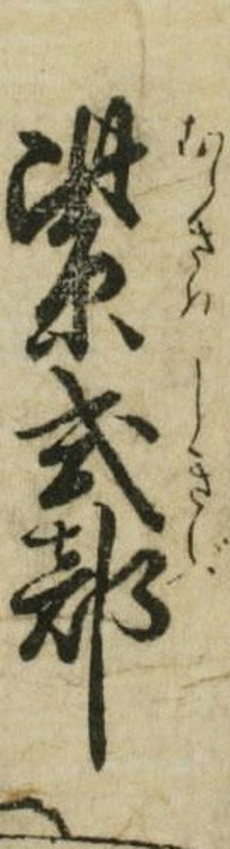紫式部
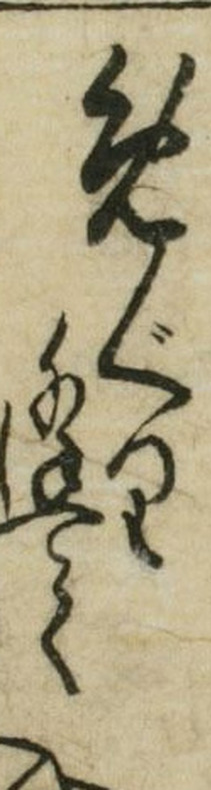めぐり
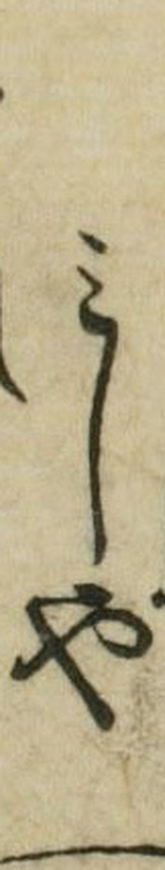みしや
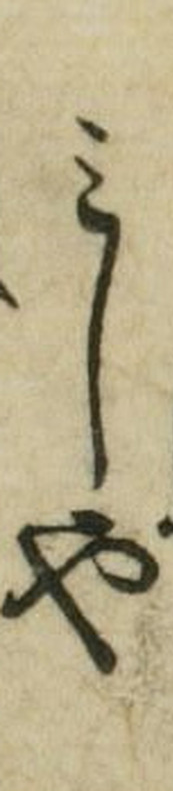みしや
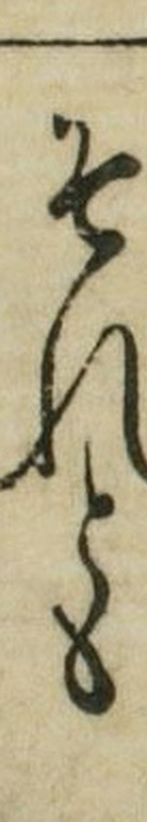それとも
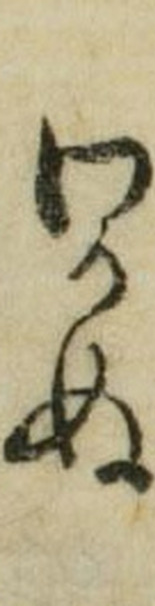わかぬ
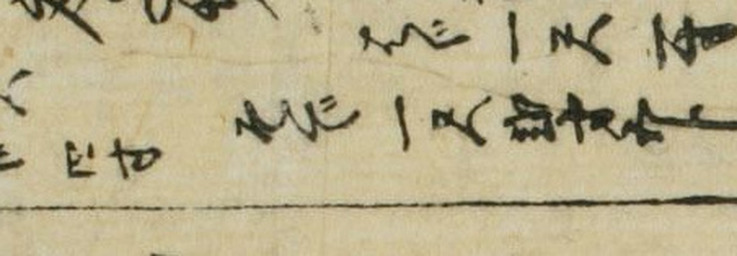たけ三尺そで一尺弐寸五分
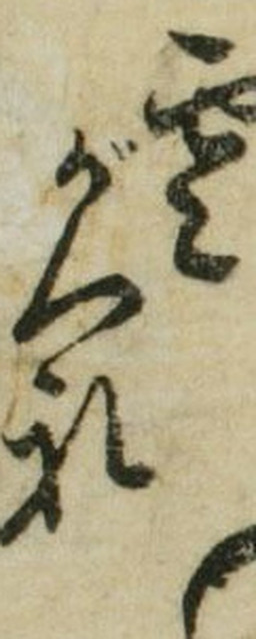がくれ
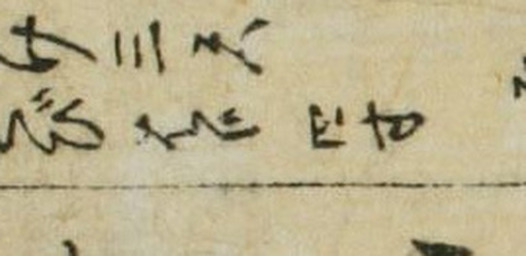おくびはゞ四寸
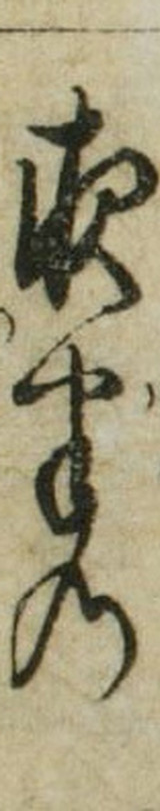夜半の
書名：百人一首
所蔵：東京学芸大学教育コンテンツアーカイブ
